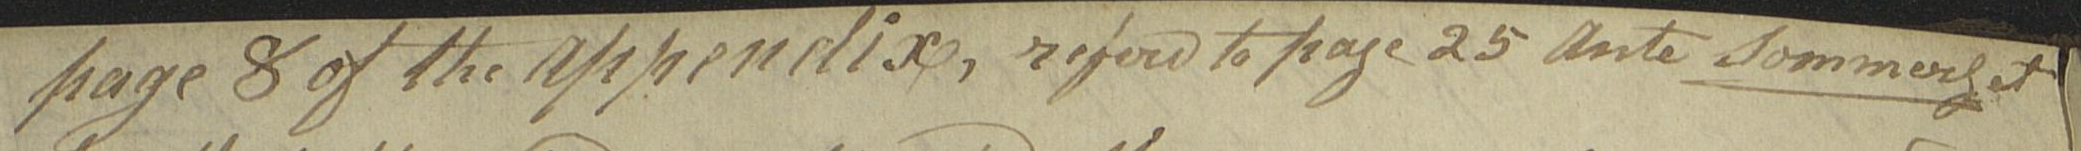page 8 of the Appendix, referd to page 25 ante Sommerset
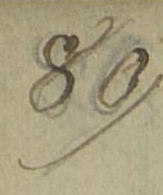80
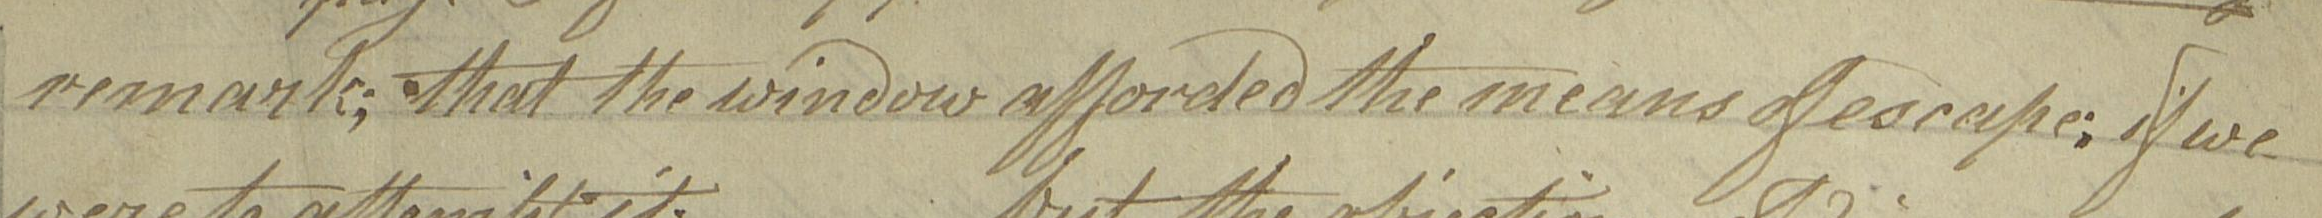remark; that the window afforded the means of escape; of we
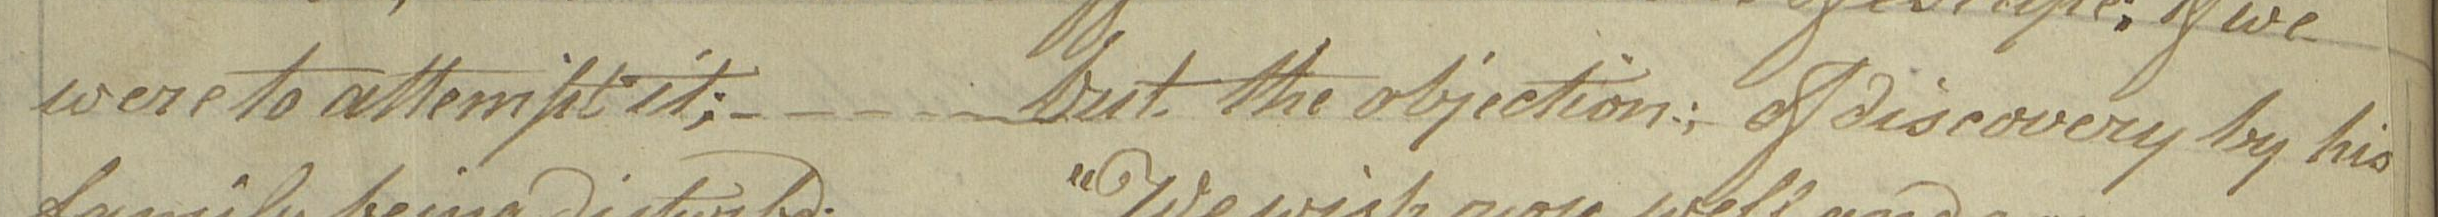were to attempt it; but the objection; of discovery by his
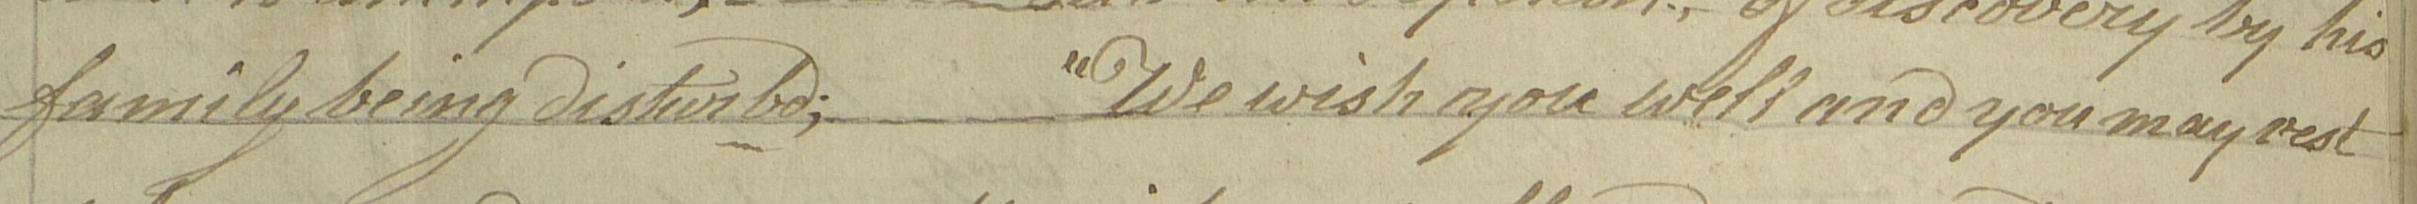family being disturbd; "We wish you well and you may rest
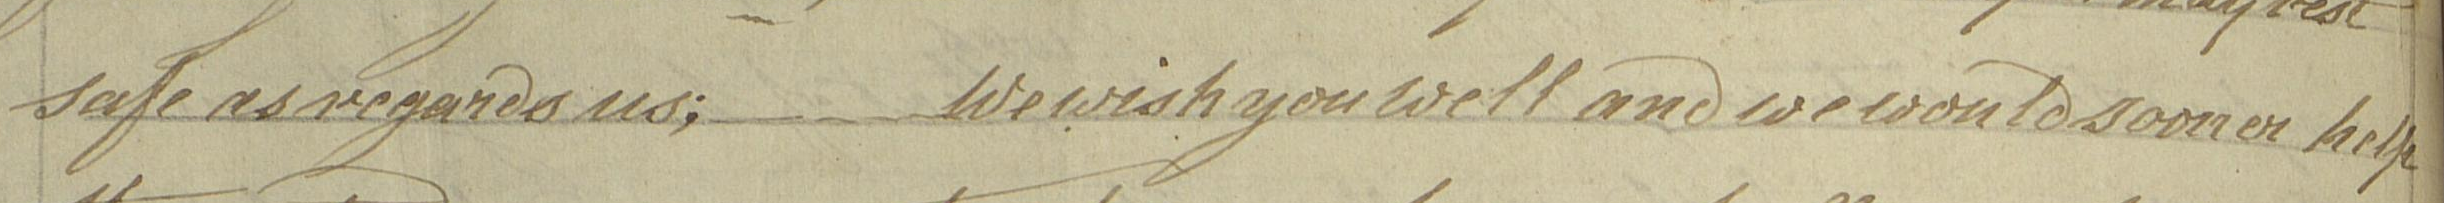safe as regards us; We wish you well and we would sooner help
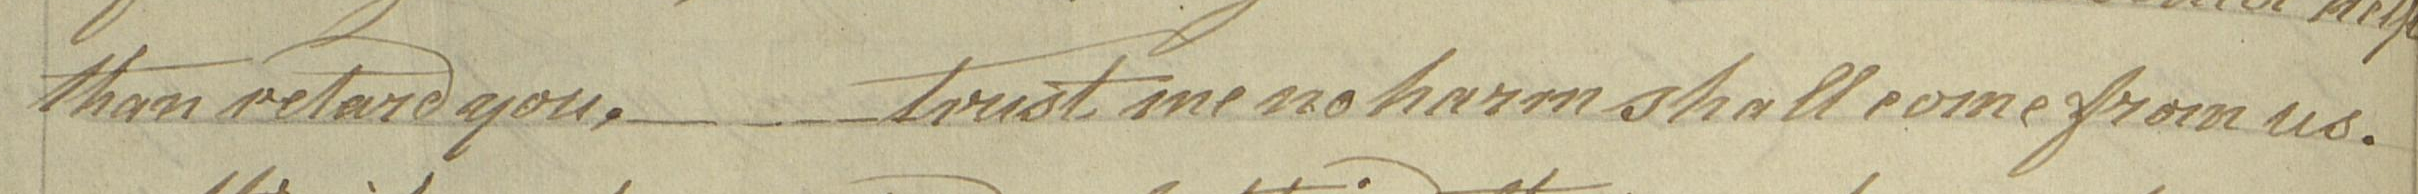than retard you. trust me no harm shall come from us.
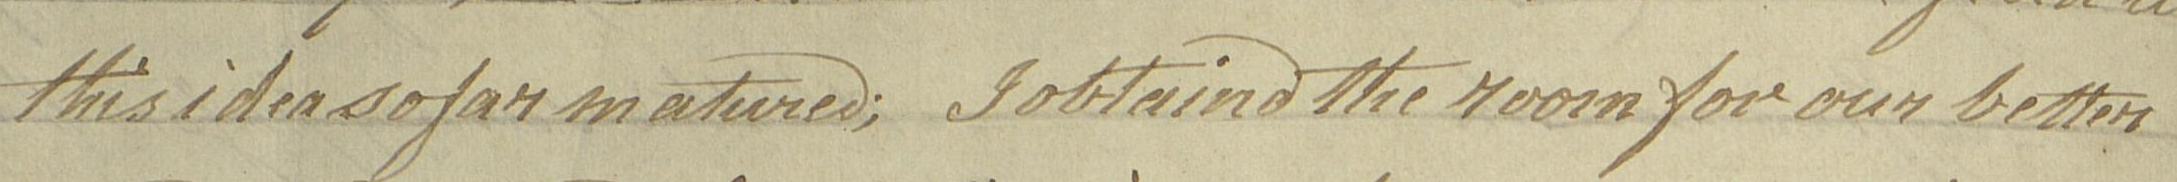this idea so far matured; I obtaind the room for our better
